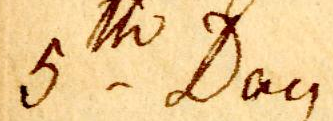5^th Day
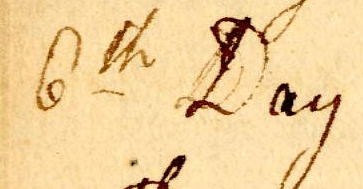6^th Day
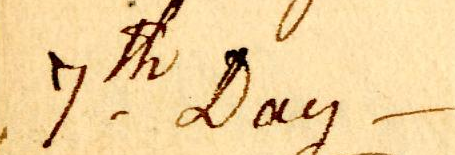7^th Day
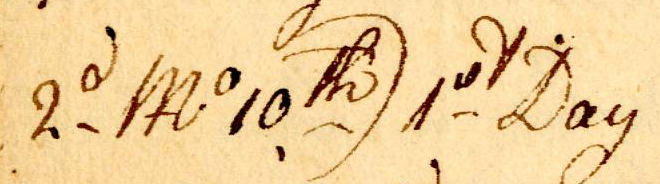2^d- M^o 10^th-)1^st- Day
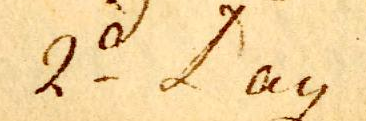2^d- Day
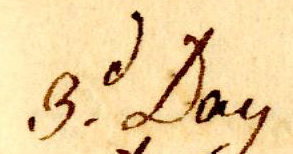3^d. Day
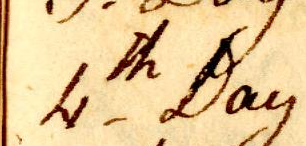4^th Day
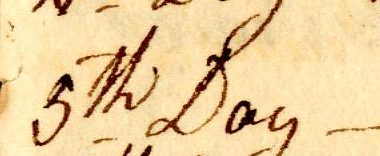5^th Day
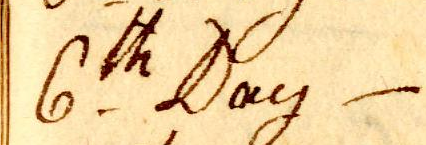6^th Day
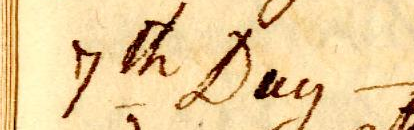7^th Day
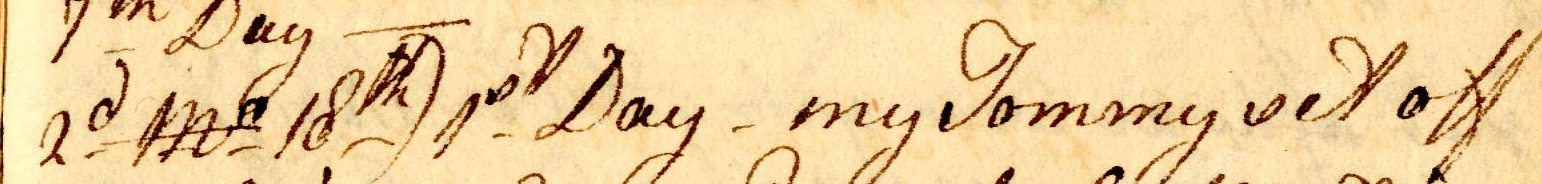2^d M^o 18^th) 1^st Day- my Tommy set off
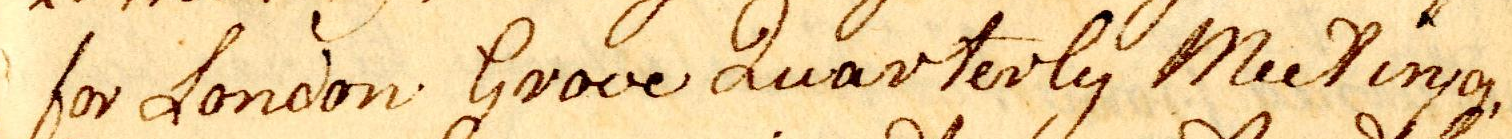for London Grove Quarterly Meeting,
